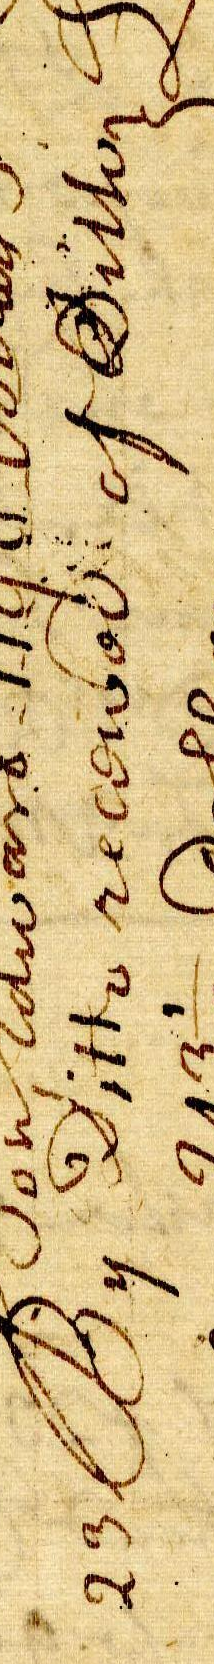23 By Ditto received of Ditto
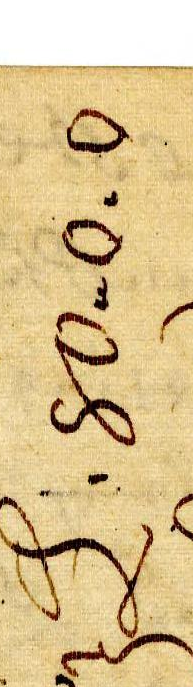£ 80..0.0
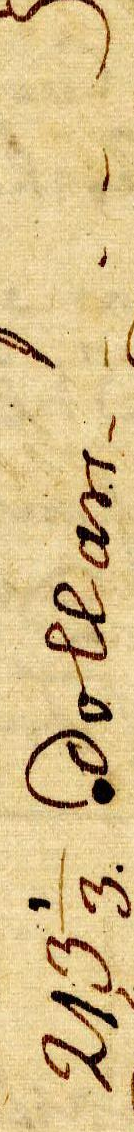213 1/3. dollars.....
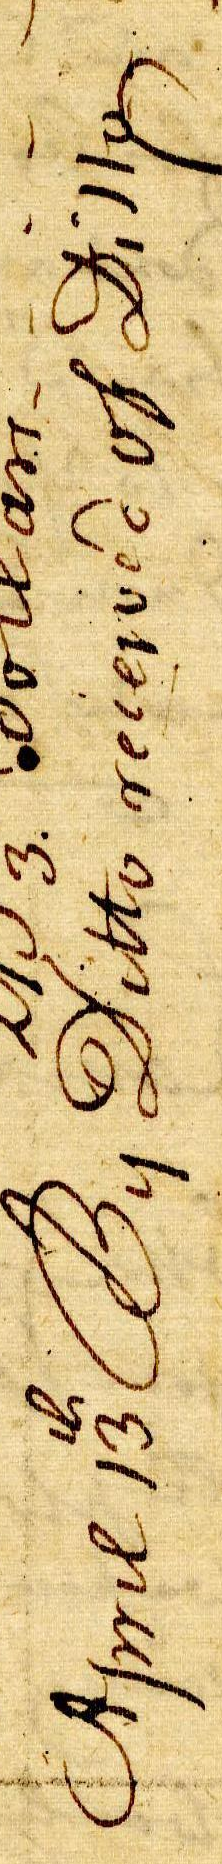April 13^th By Ditto received by Ditto
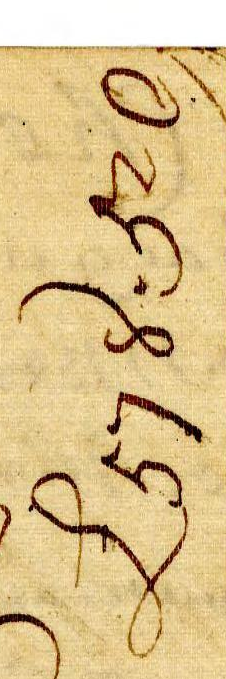£578.5 0
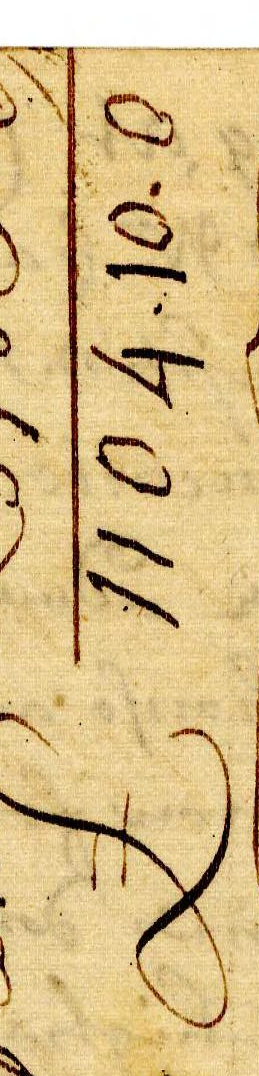₤ 1104.10.0
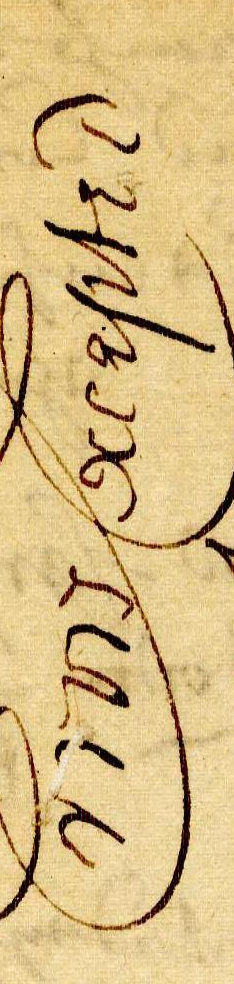Errors Excepted
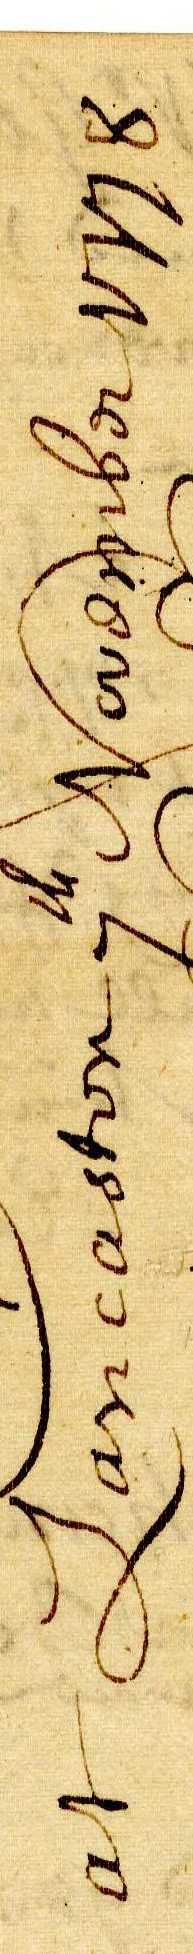at Lancaster 7^th November 1778
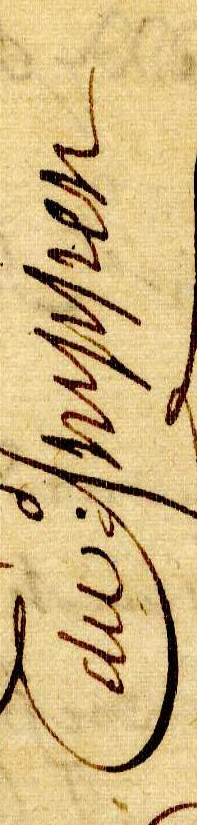Edw^d. Shippen
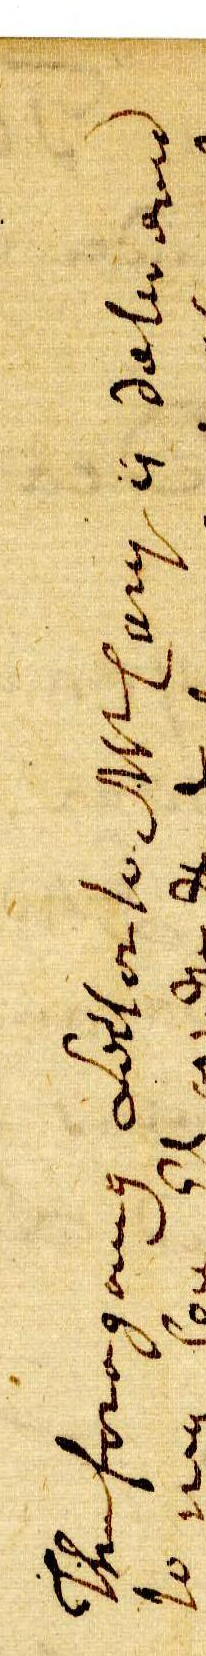The foregoing Letter to M^r Cary is delivered
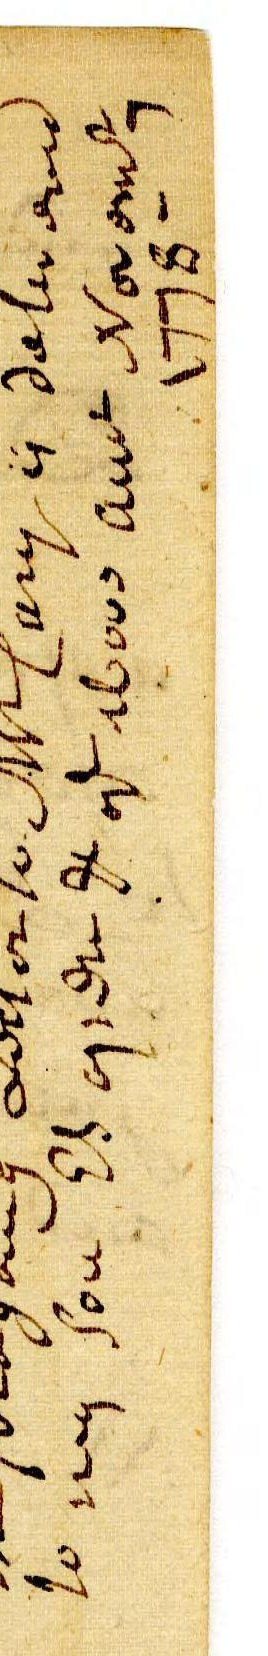to my Son ES & y^e above acc^t Novem^r
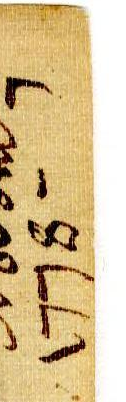1778-
